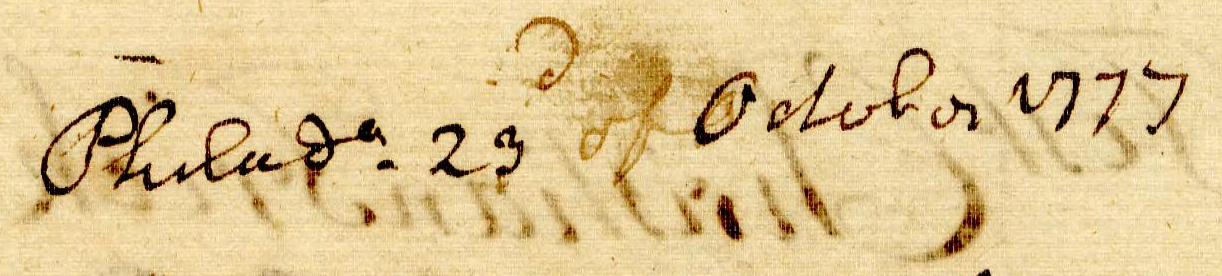Phidad^a. 23^d of October 1777
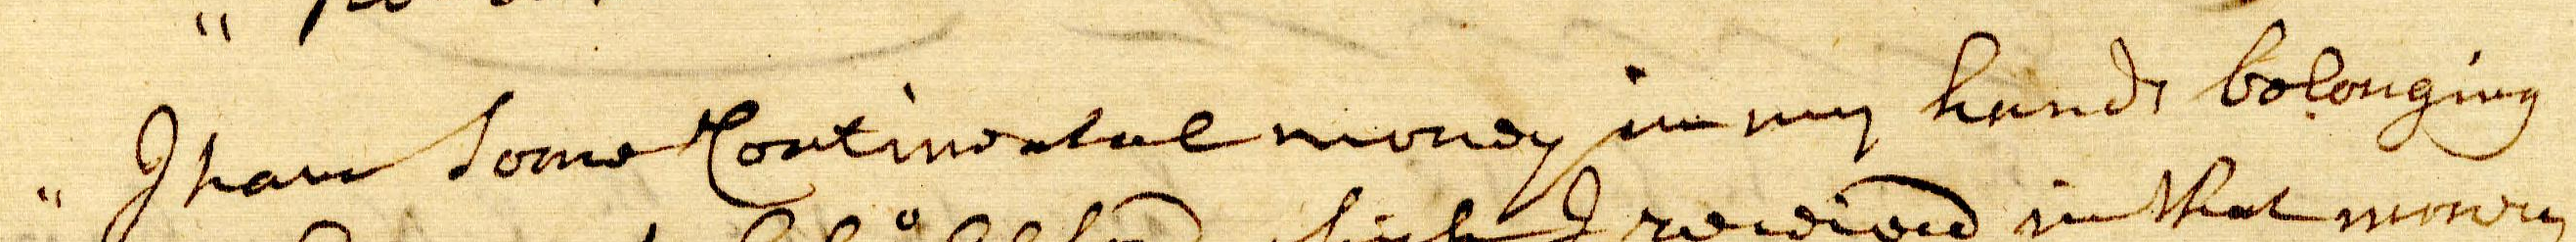"I have some Continental money in my hands belonging
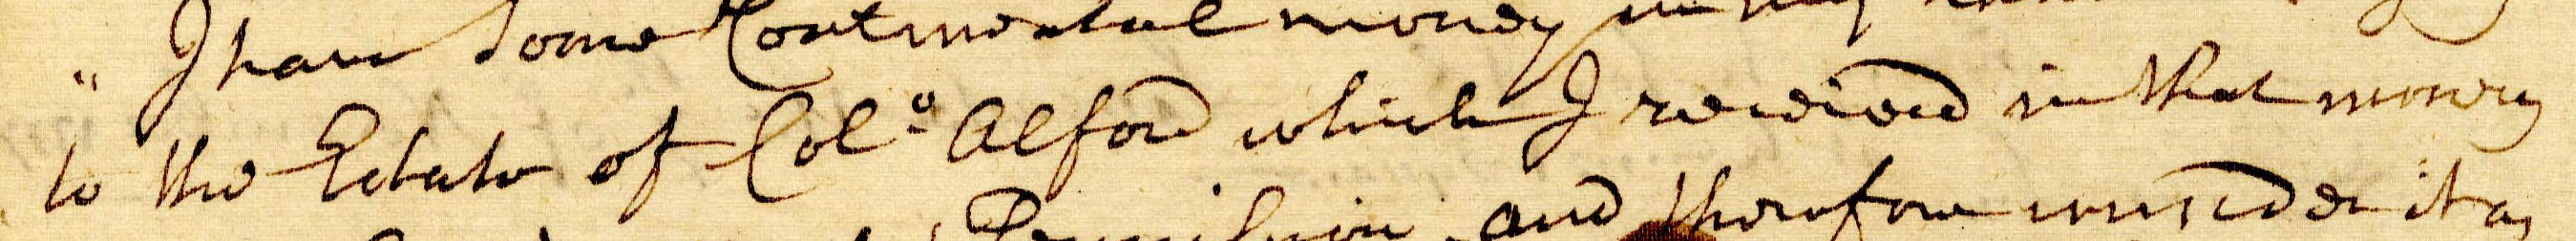to the Estate of Col^l. Alford which I received in that money
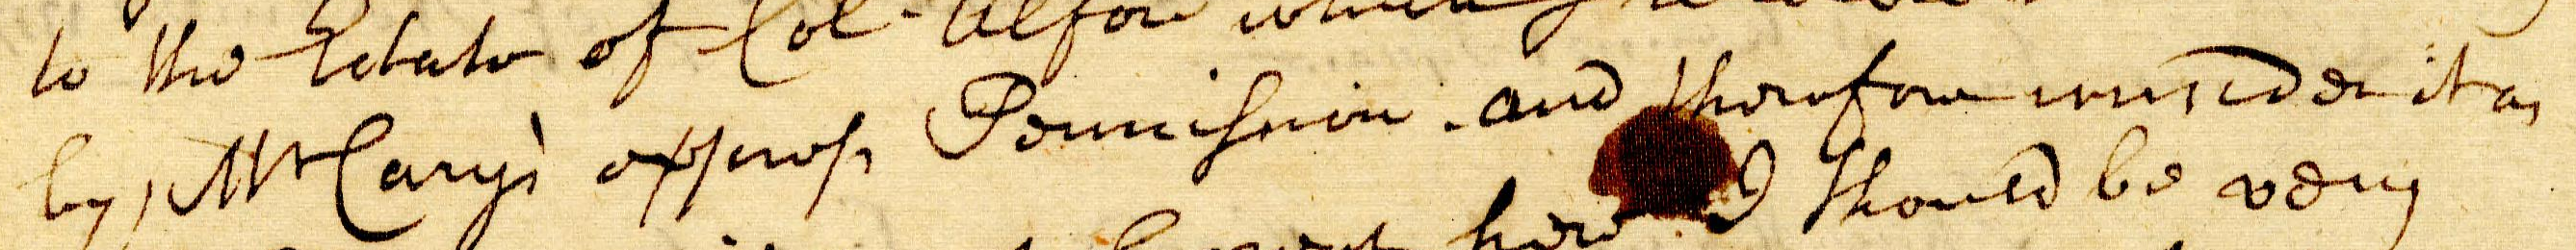by M^r Carys express Permission. and therefore consider it as
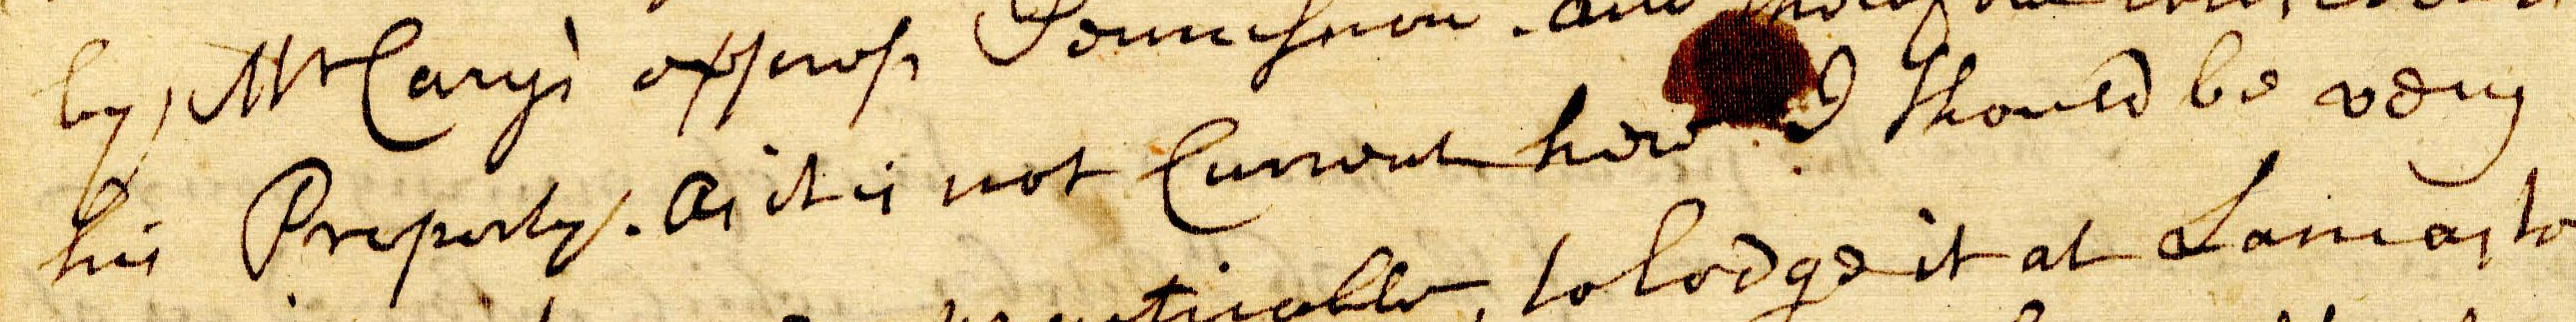his Property. As it is not Current how I should be very
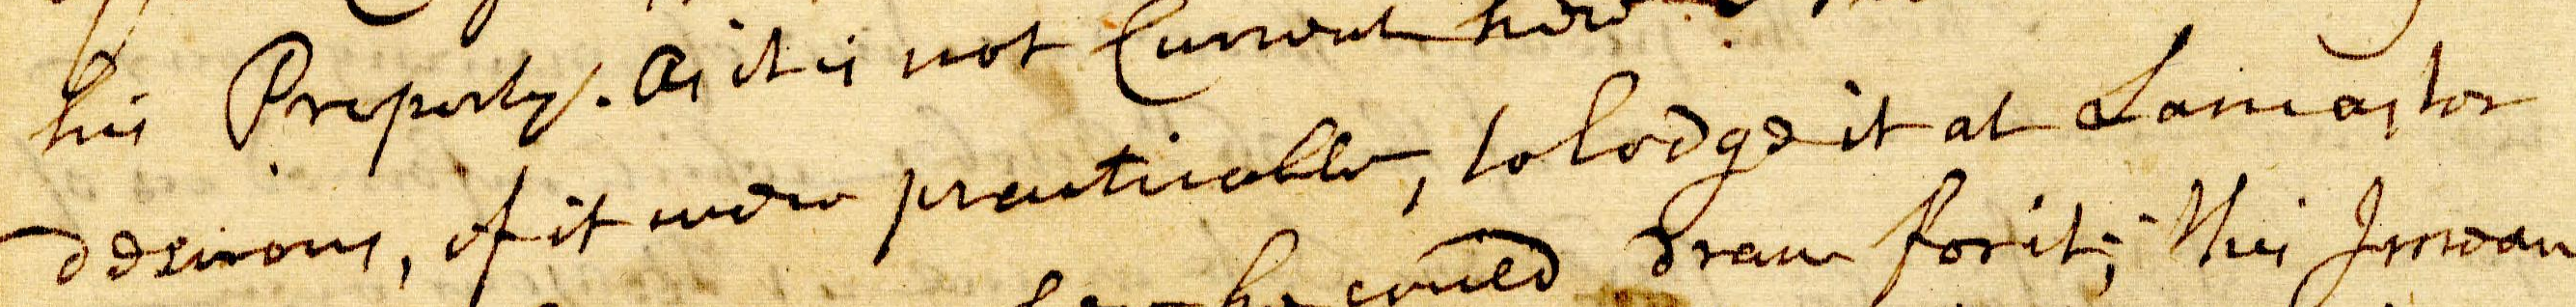desirous, if it were practicable, to lodge it at Lancaster
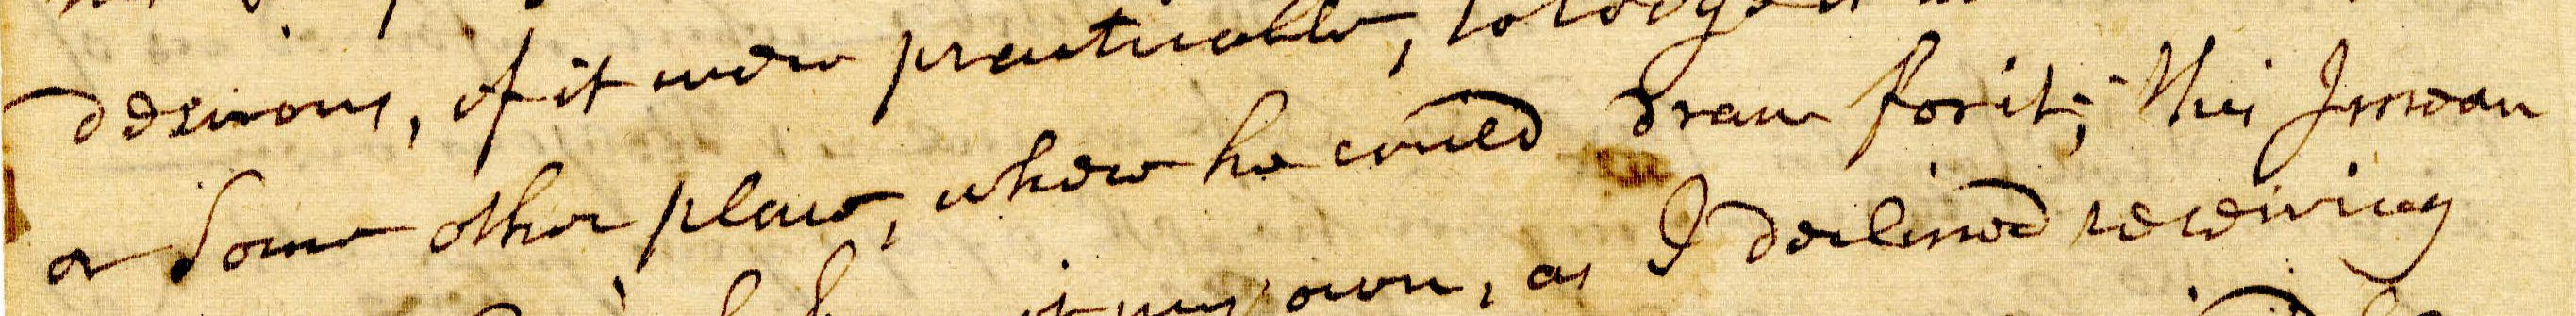or Some other place where he could draw for it; this Irrwan
